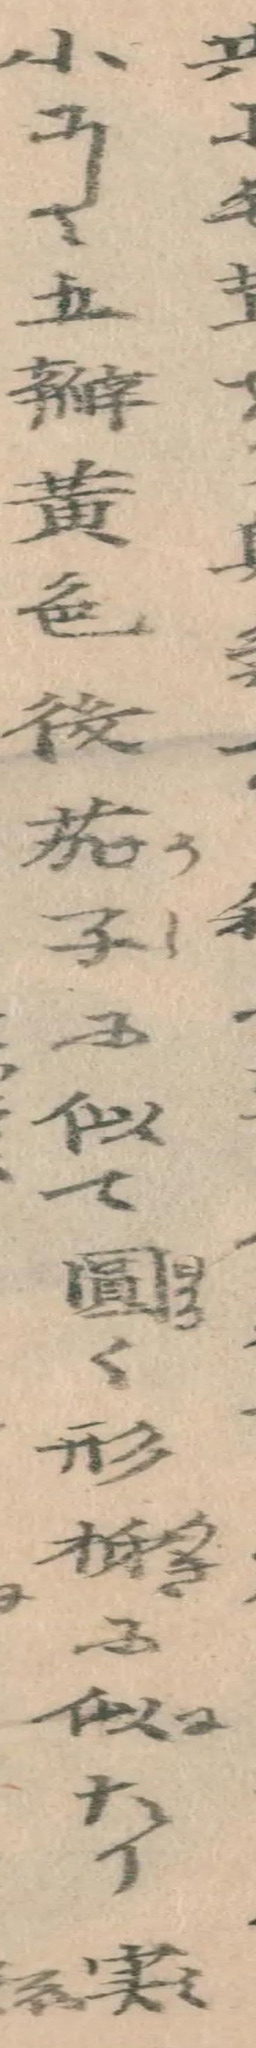小にして五弁黄色後茄子に似て円く形柿に似たり実
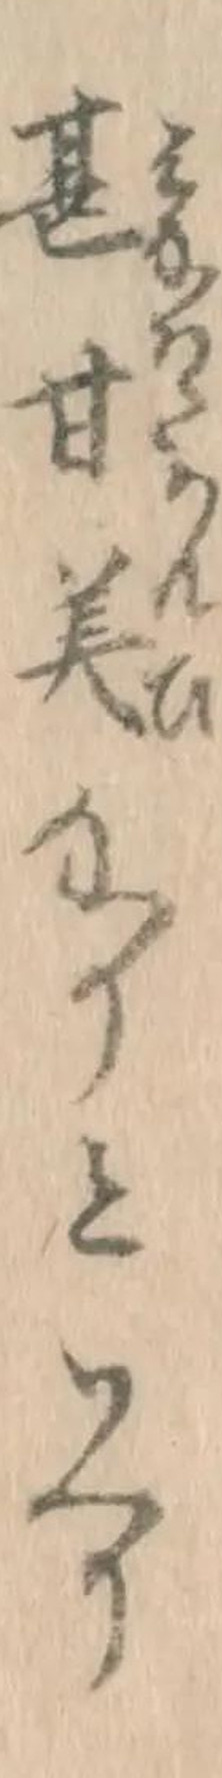甚甘美なりといへり

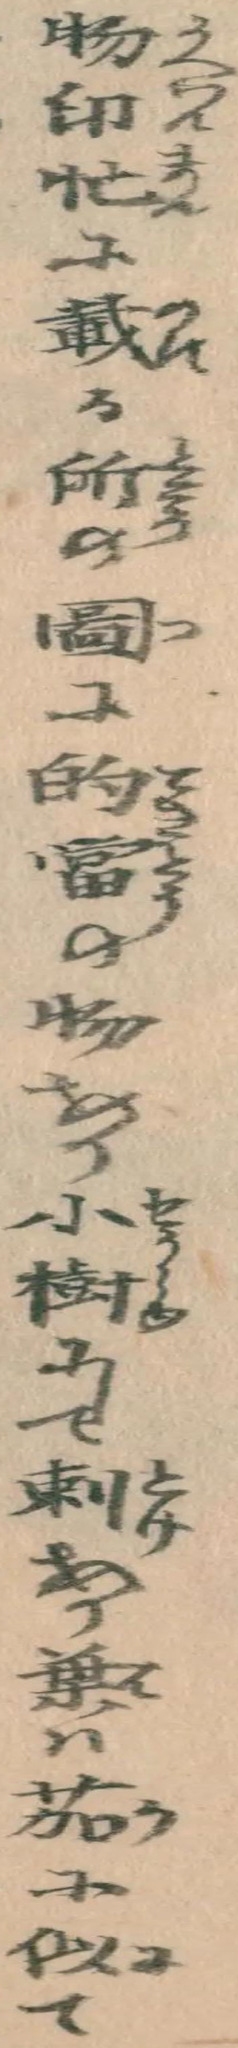物印忙に載る所の図に的当の物あり小樹にして剌あり葉は茄に似て
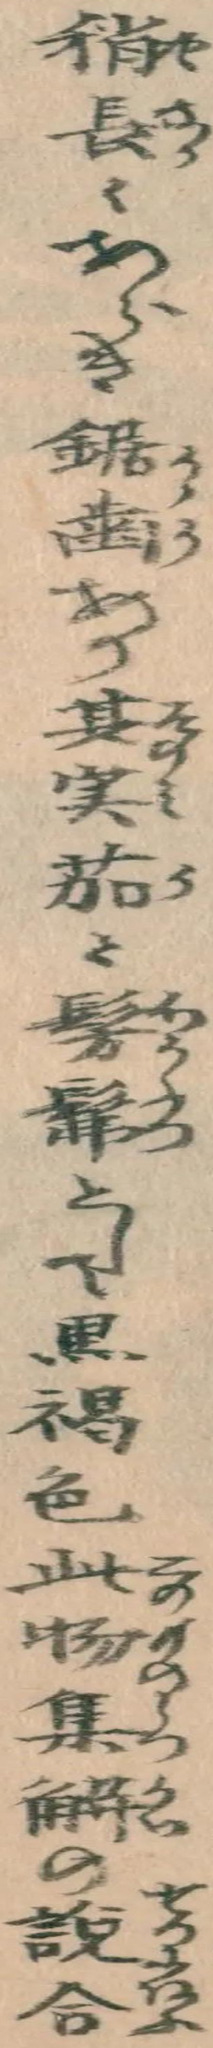稍長くあらき鋸歯あり其実茄と髣髴として黒褐色此物集解の説合
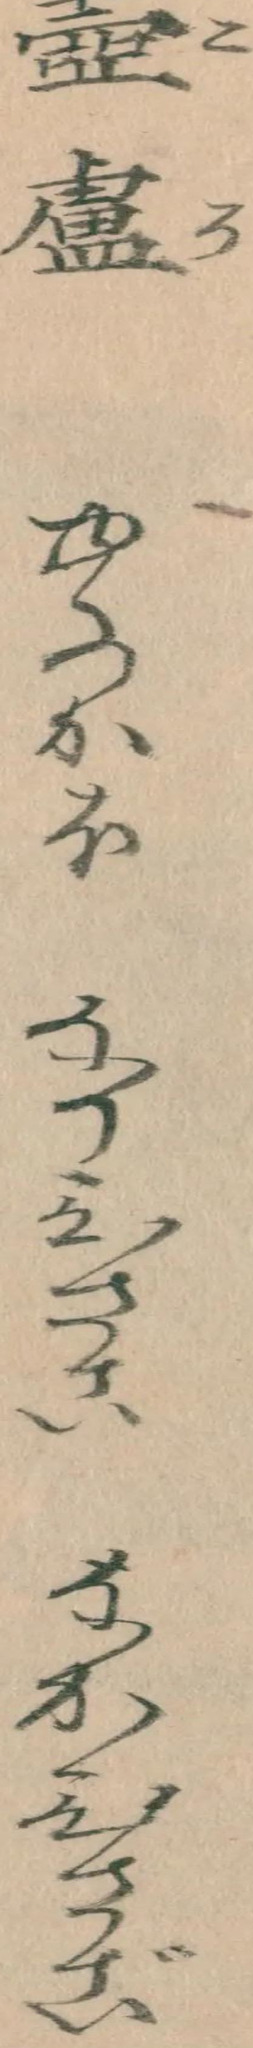壺盧ゆふかほなりひさこなかひさご
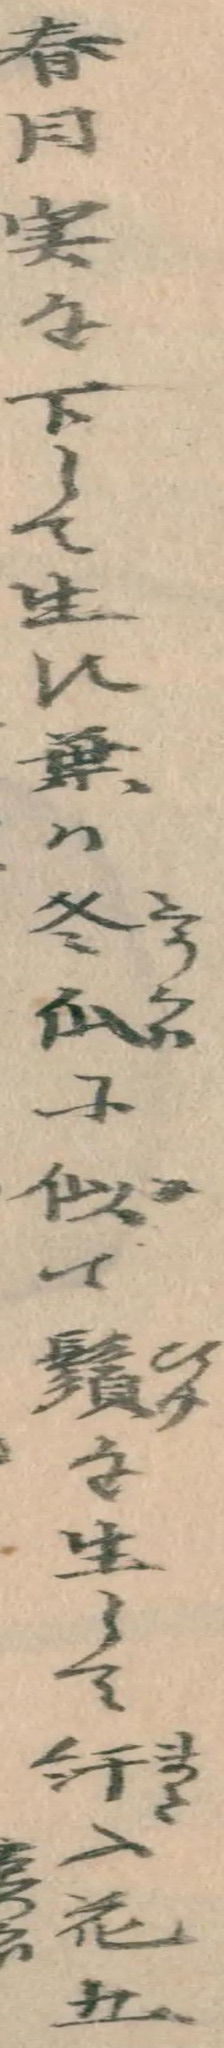春月実を下して生す葉は冬瓜に似て鬚を生して紆ふ花五
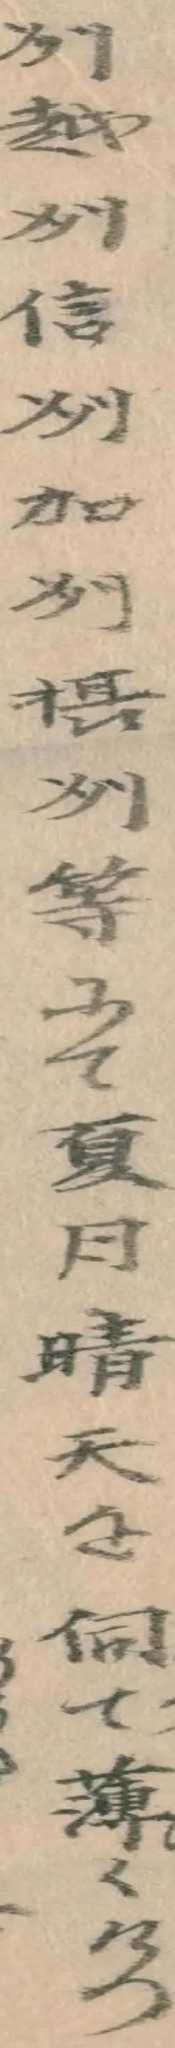州越州信州加州摂州等にて夏月晴天を伺て薄くけつ
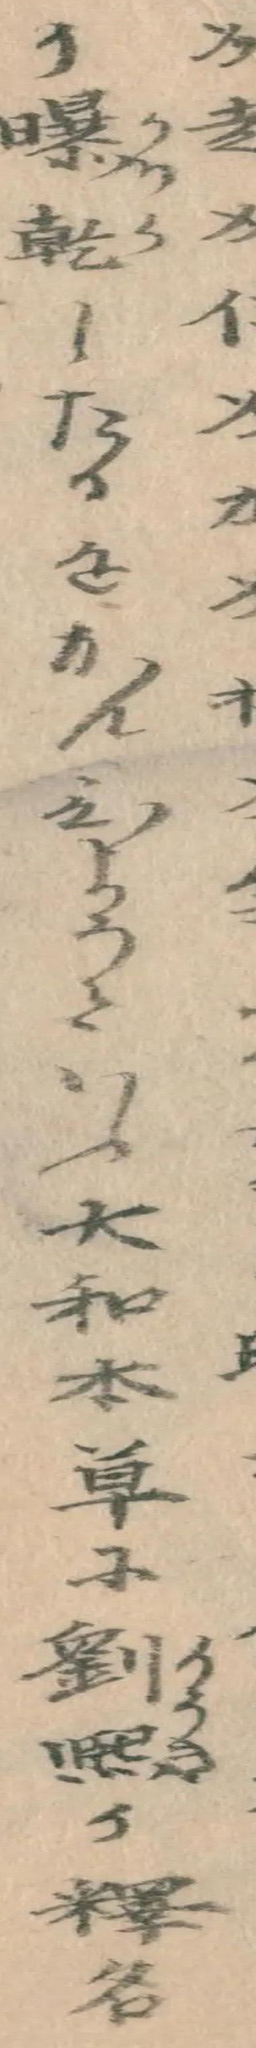り曝乾したるをかんひようといふ大和本草に劉煕か釈名
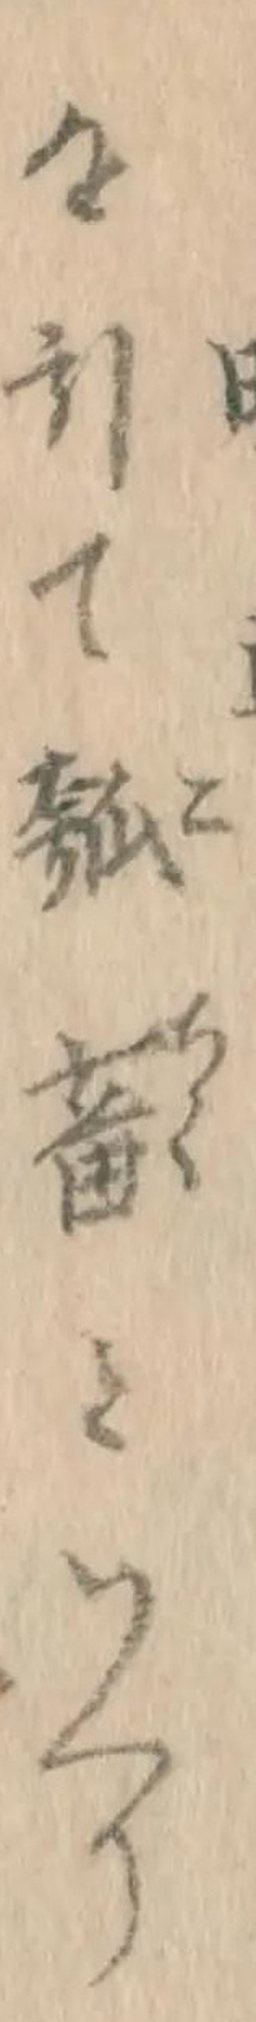を引て瓠畜といへり

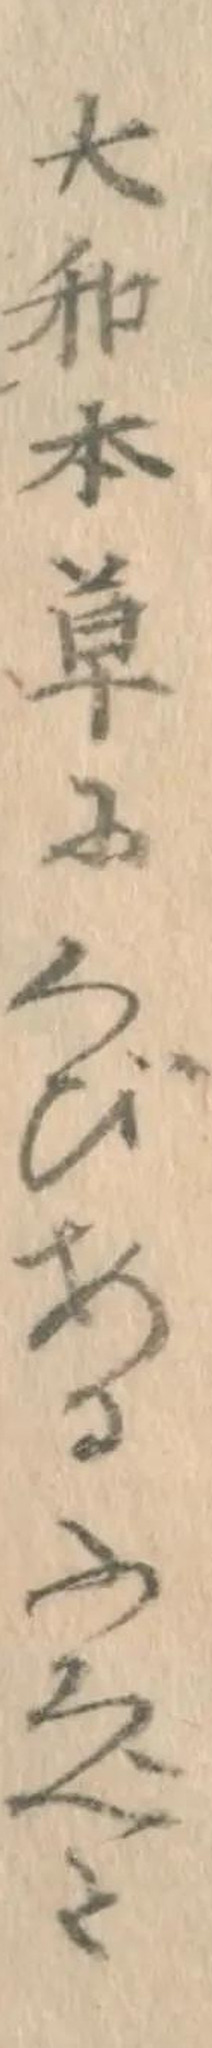壺大和本草にくびあるふくべと
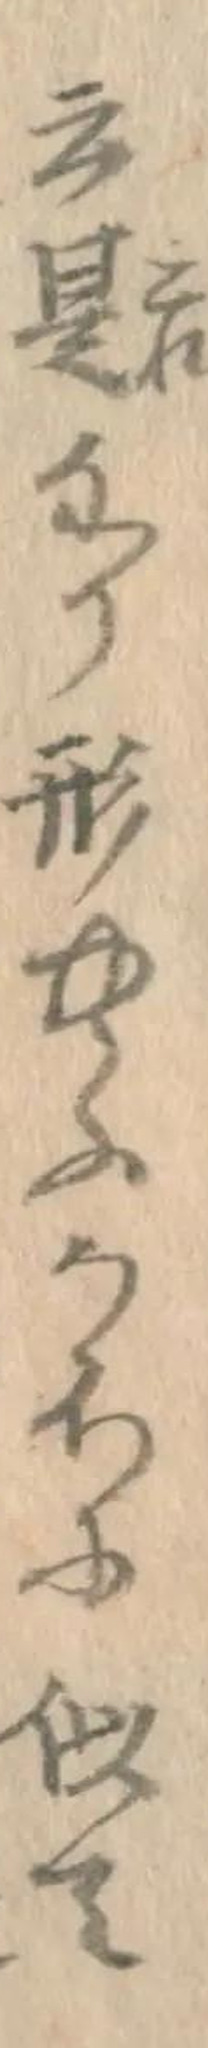云是なり形ゆふかほに似て

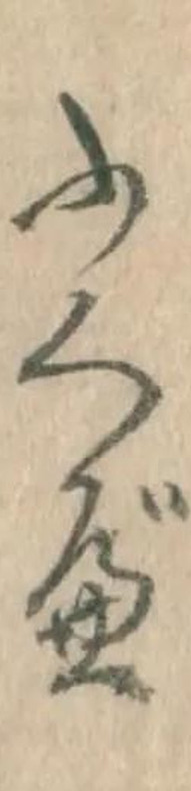ふくべ
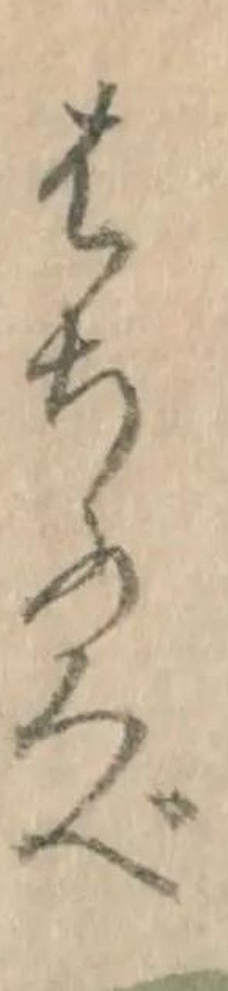はちふくべ
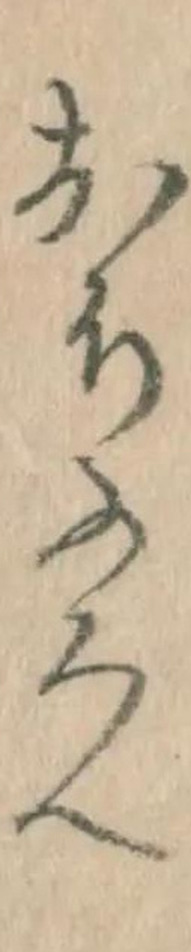おほふくへ
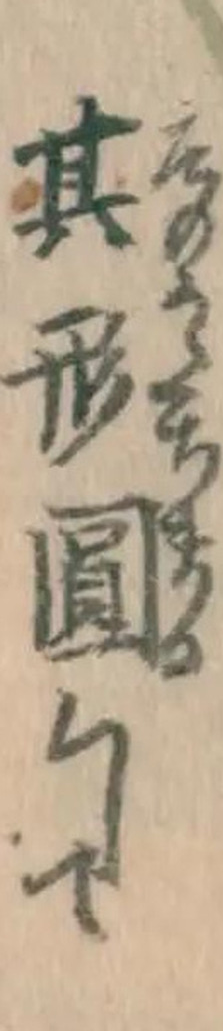其形円くして
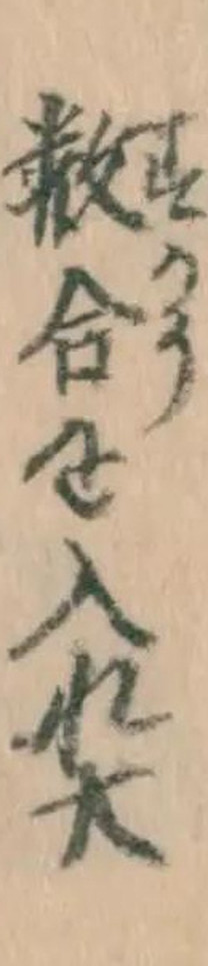数合を入れ大
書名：本草図譜. 巻52-54
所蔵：国立国会図書館 National Diet Library, JAPAN
